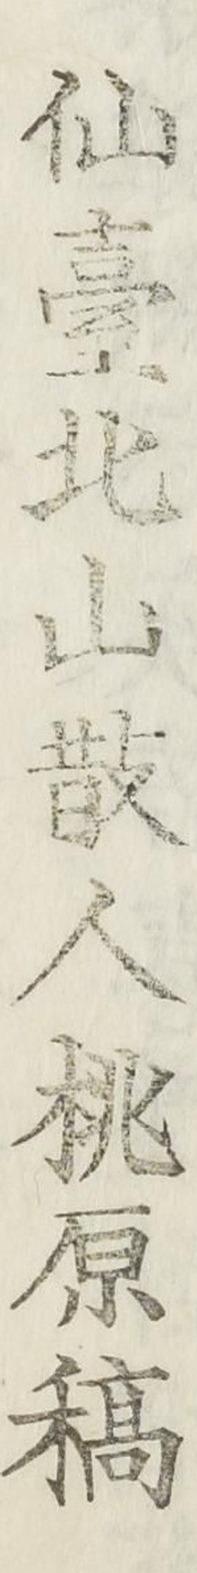仙台北山散人桃原稿
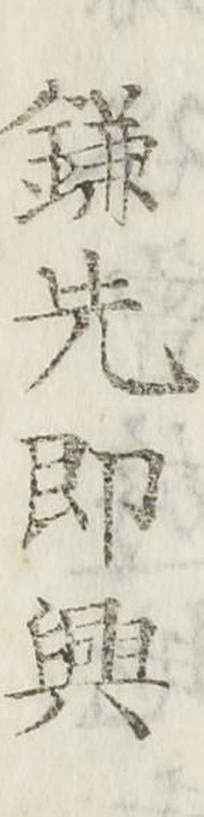鎌先即興

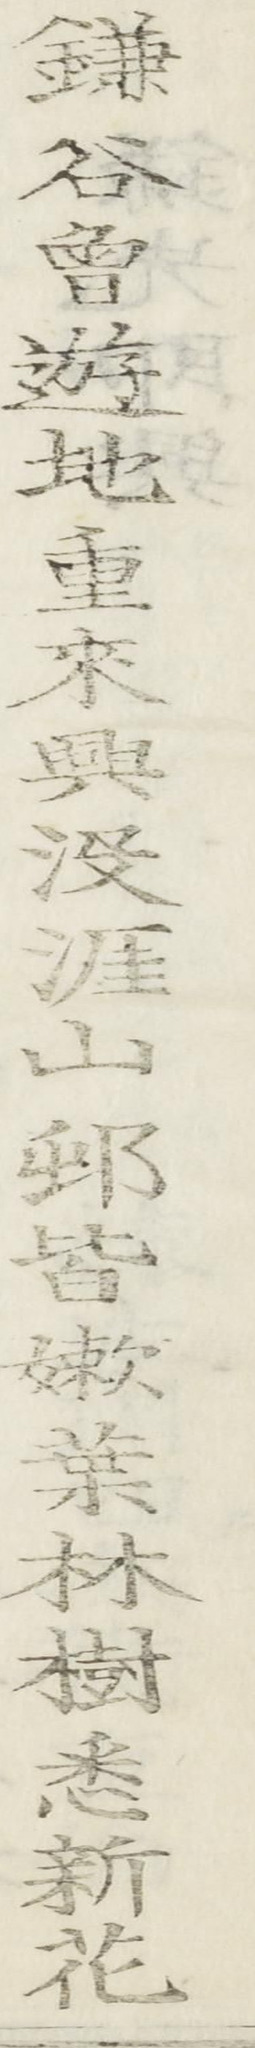鎌谷曽遊地重來興没涯山郵皆嫰葉林樹悉新花
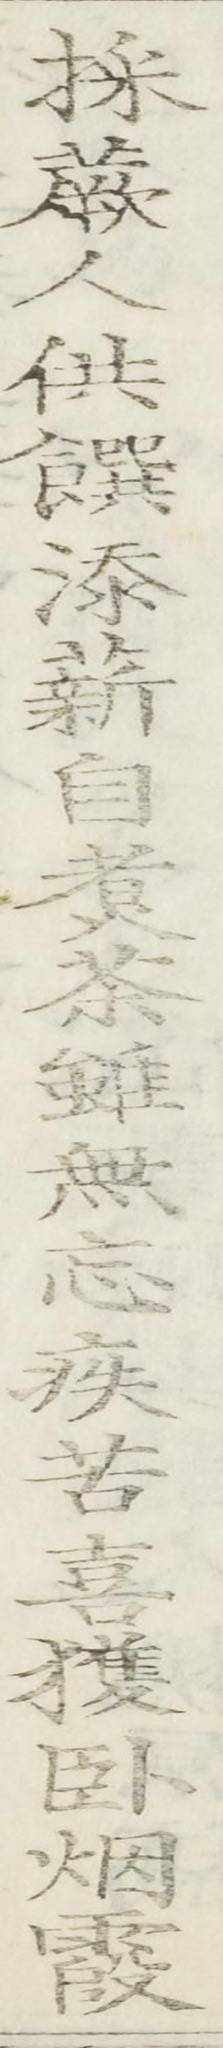採蕨人供饌添薪自煮茶雖無忘疾苦喜獲卧烟霞
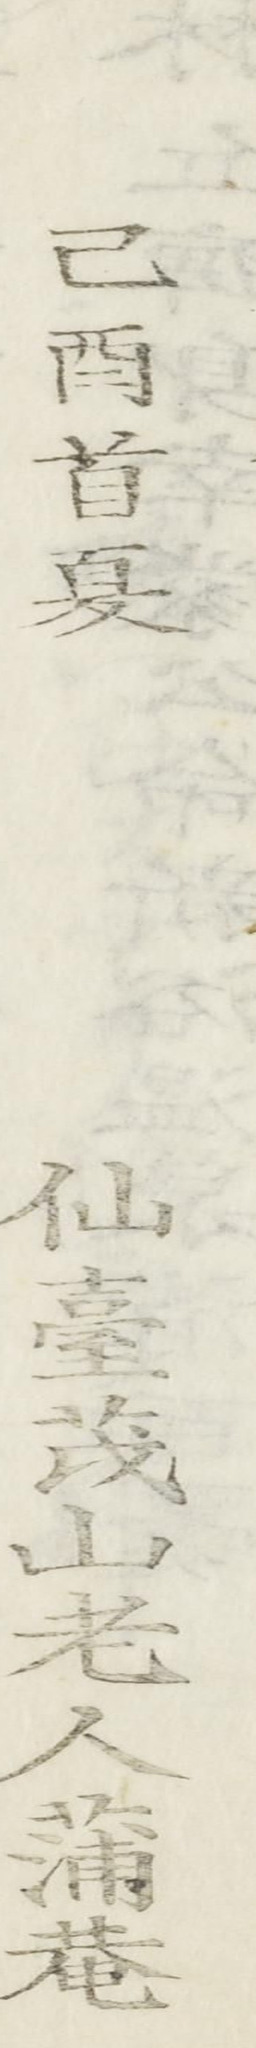己酉首夏仙台茂山老人蒲菴
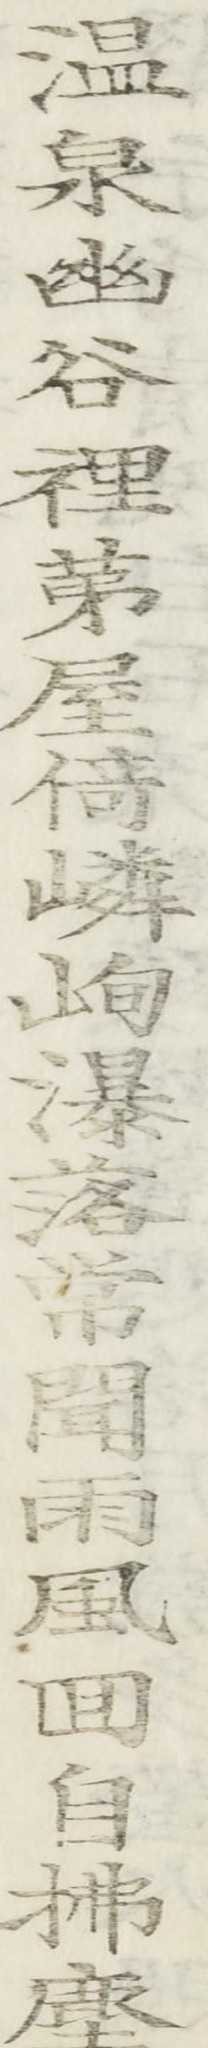温泉幽谷裡茅屋倚嶙峋瀑落常聞雨風回自拂塵
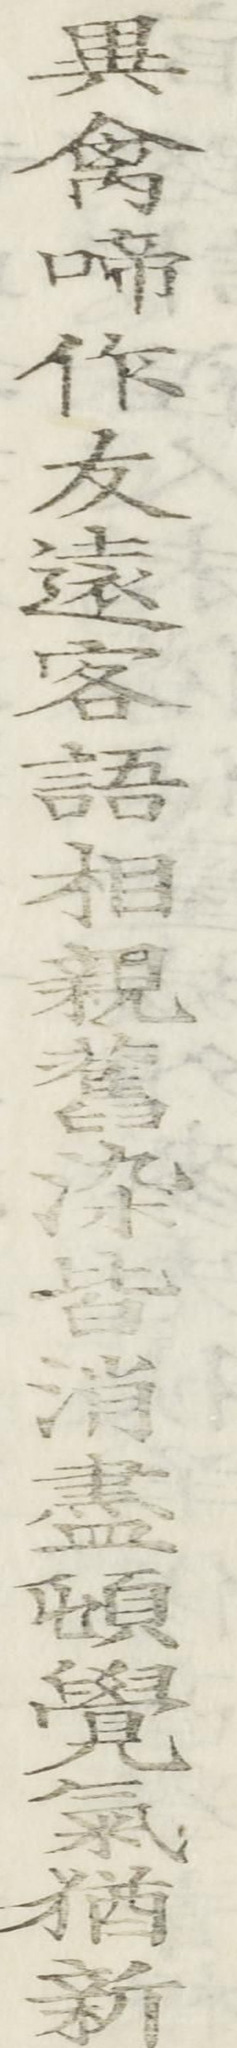異禽啼作友遠客語相親旧染皆消尽頓覚気猶新
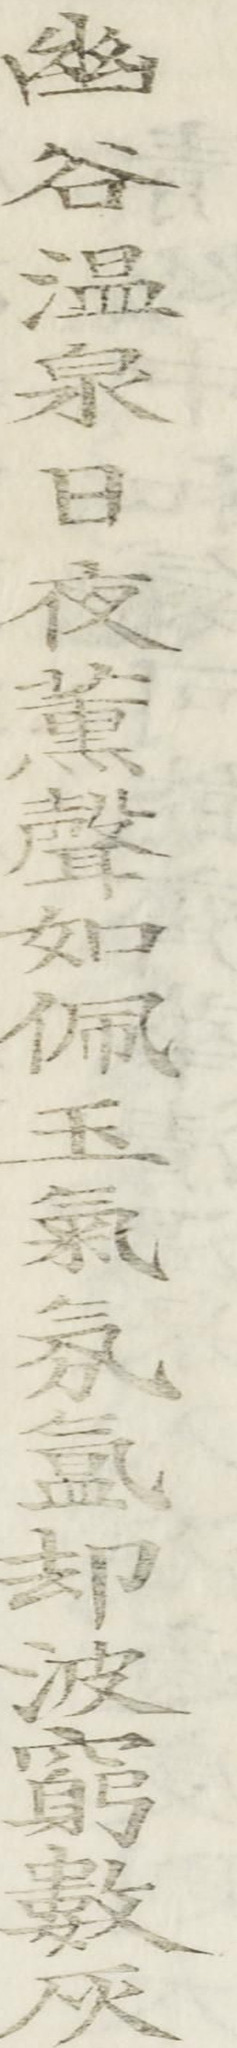幽谷温泉日夜薰声如佩玉気氛氳却波窮数灰疑
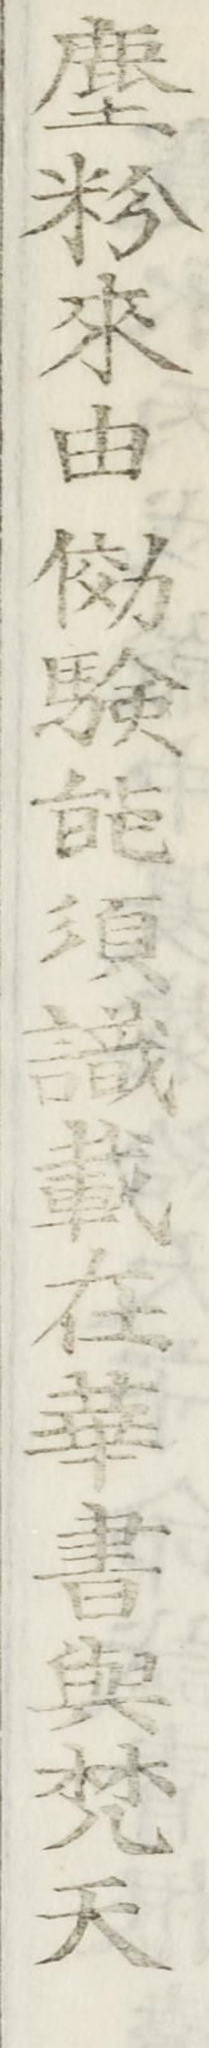塵粉來由俲験能須識載在華書与梵天
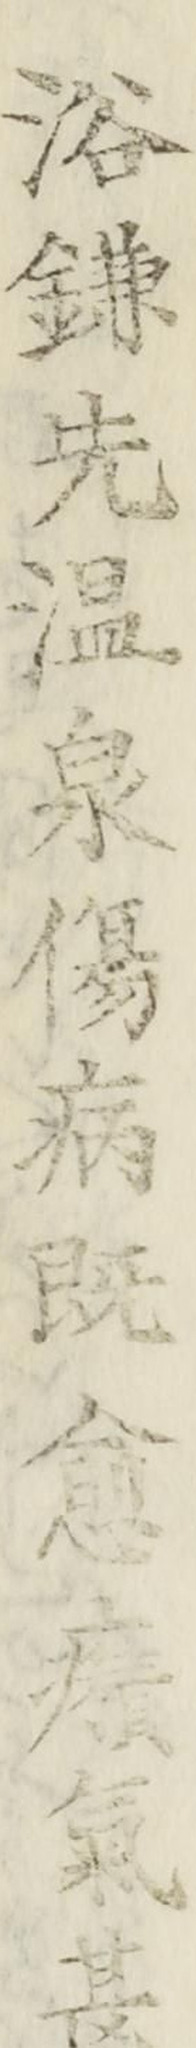浴鎌先温泉傷病既愈疾気甚
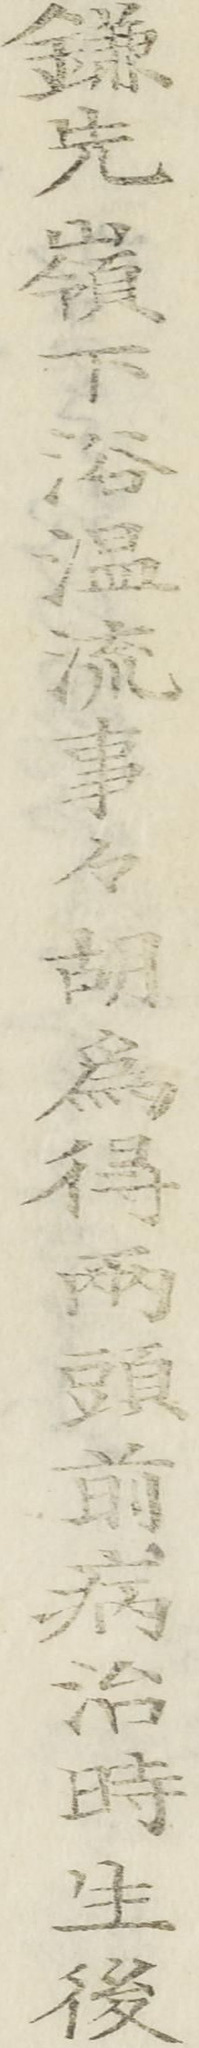鎌先嶺下浴温流事々胡為得兩頭前病治時生後
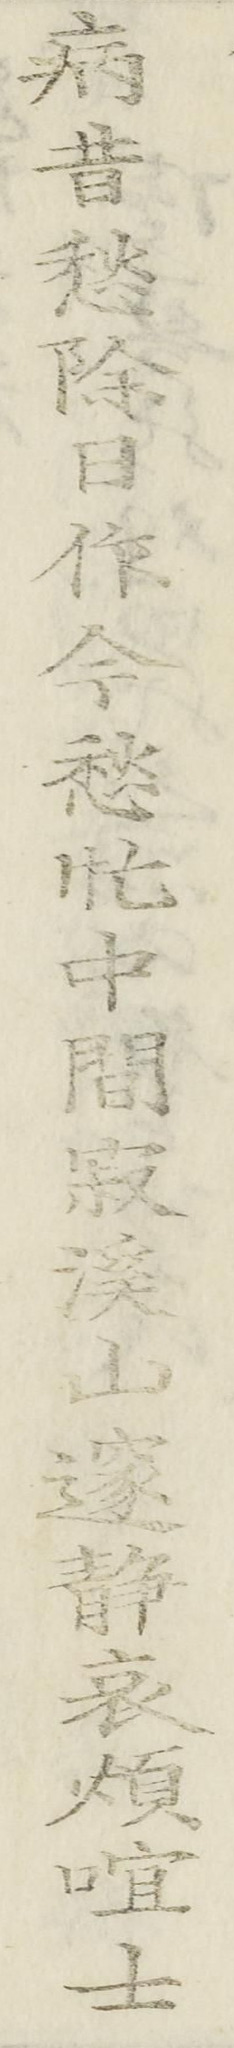病昔愁除日作今愁忙中間寂淡山邃静哀煩喧士
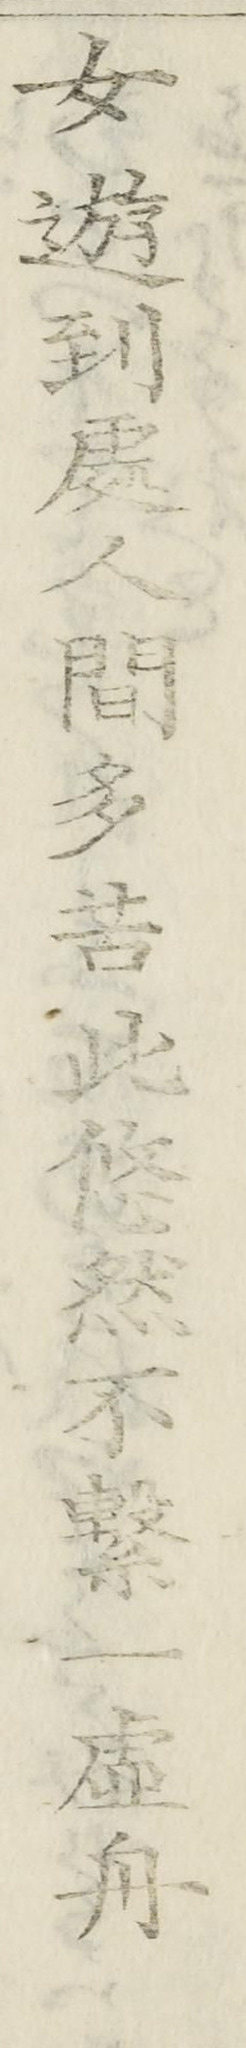女遊到底人間多苦此悠然不繋一虚舟
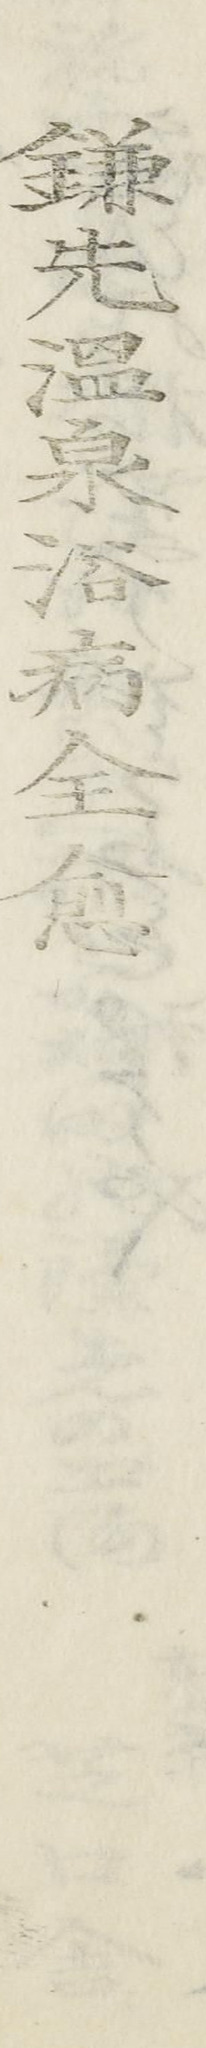鎌先温泉浴病全愈
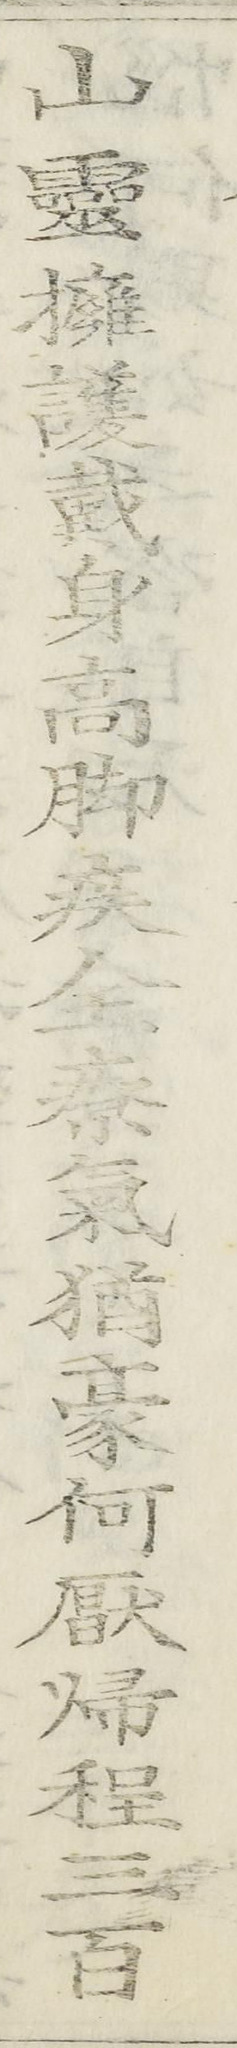山霊擁護戴身高脚疾全療気猶豪何厭帰程,三百
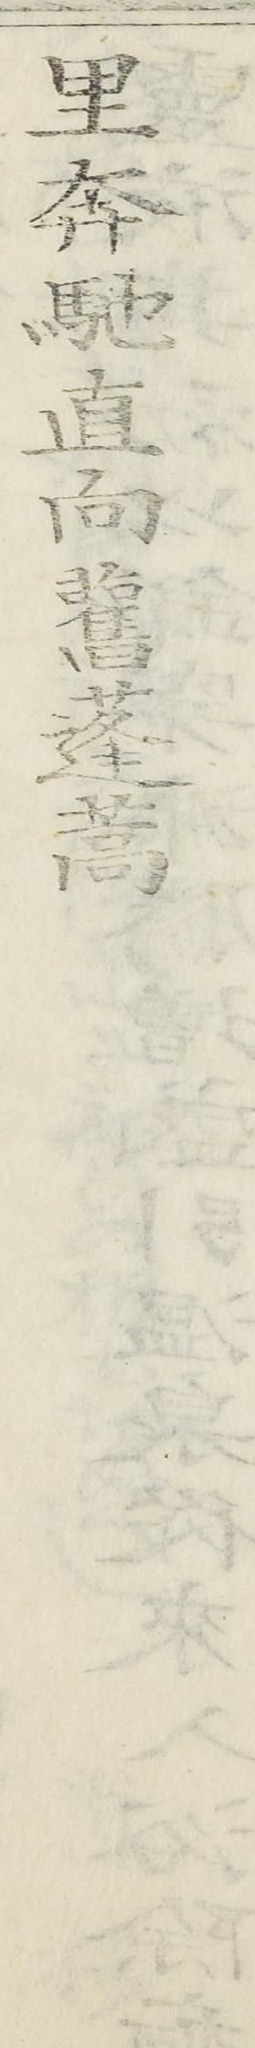里奔馳直向醤蓬蒿
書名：鎌先温泉由來記
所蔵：東京大学地震研究所図書室 Earthquake Research Institute Library, The University of Tokyo, JAPAN
